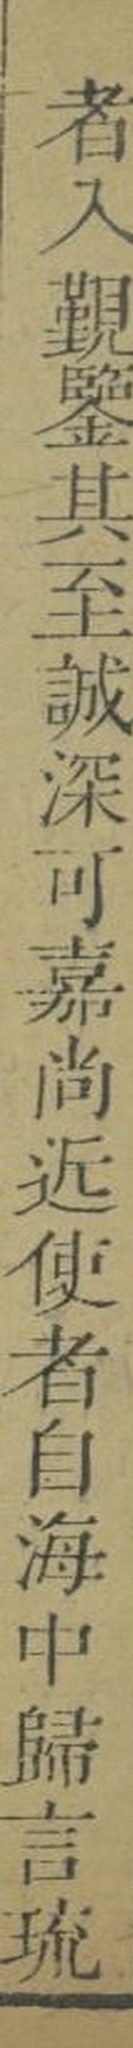者入覲鑑其至誠深可嘉尚近使者自海中帰言琉
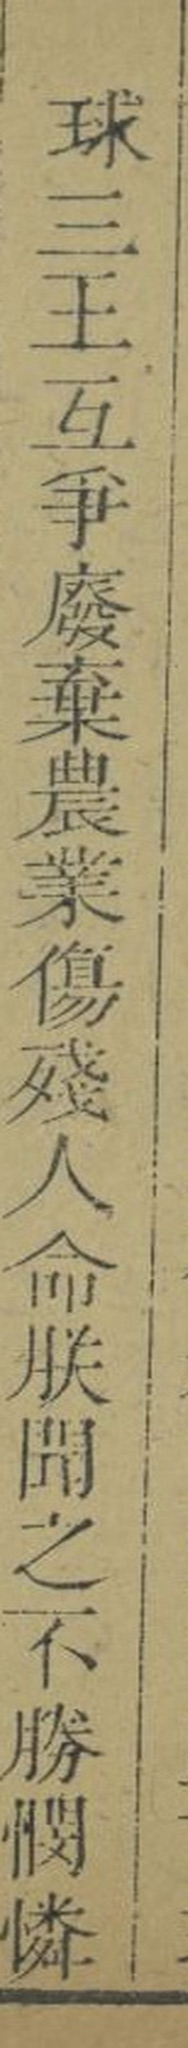球三王互争廃棄農業傷残人命朕聞之不勝憫憐
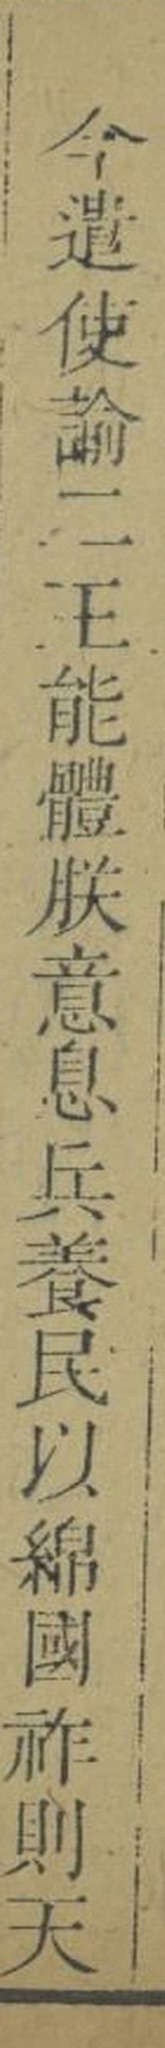今遣使諭二王能体朕意息兵養民以綿国祚則天
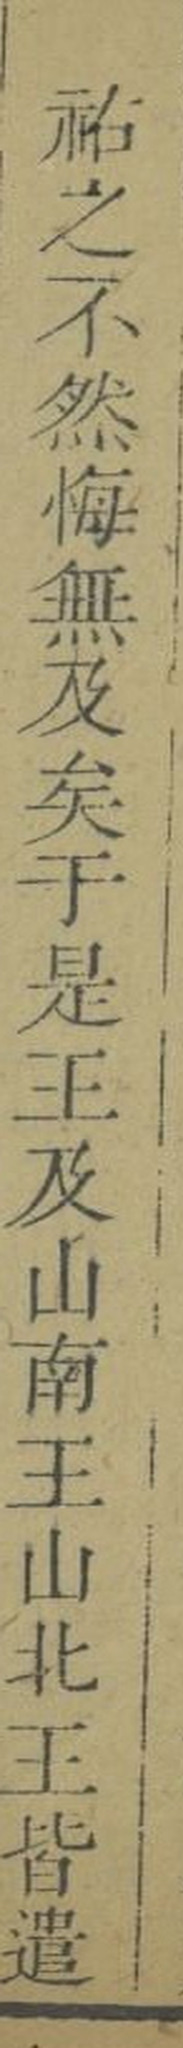祐之不然悔無及矣于是王及山南王山北王皆遣
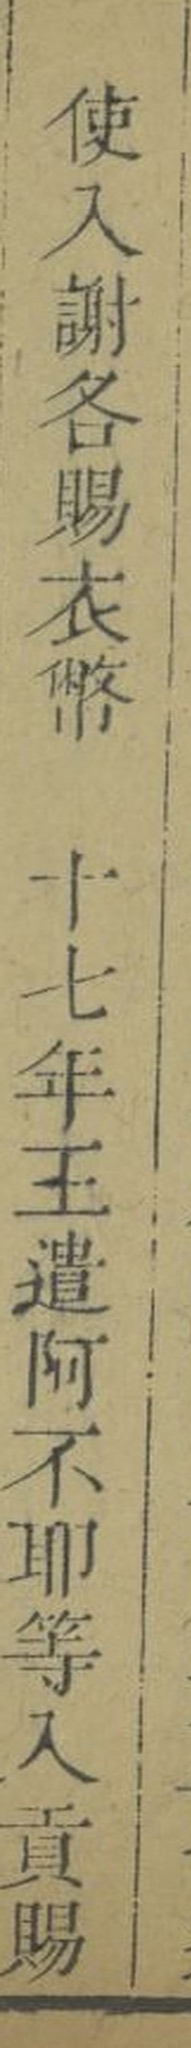使入謝各賜衣幣十七年王遣阿不耶等入貢賜
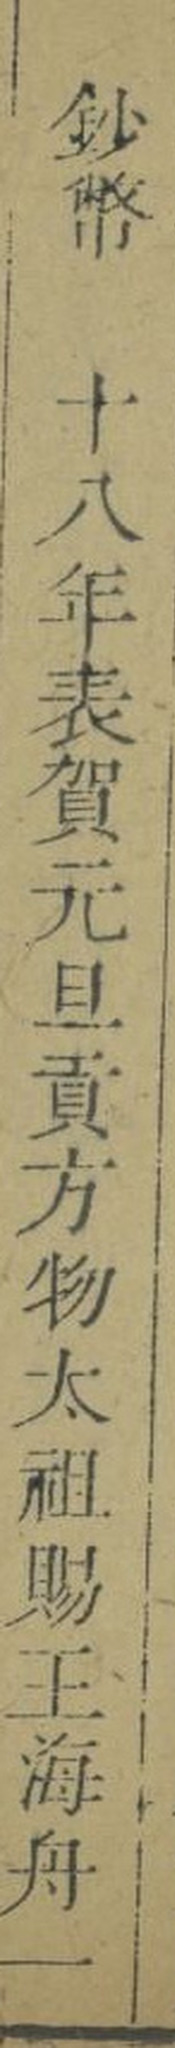鈔幣十八年表賀元旦貢方物太祖賜王海舟一
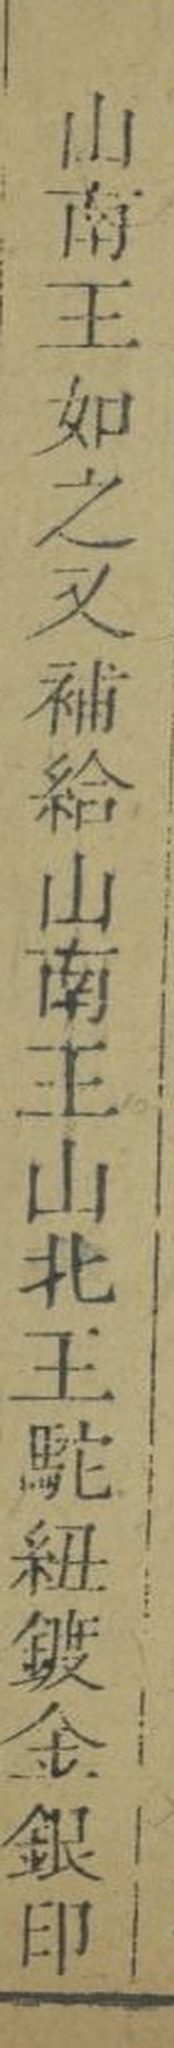山南王如之又補給山南王山北王駝紐鍍金銀印
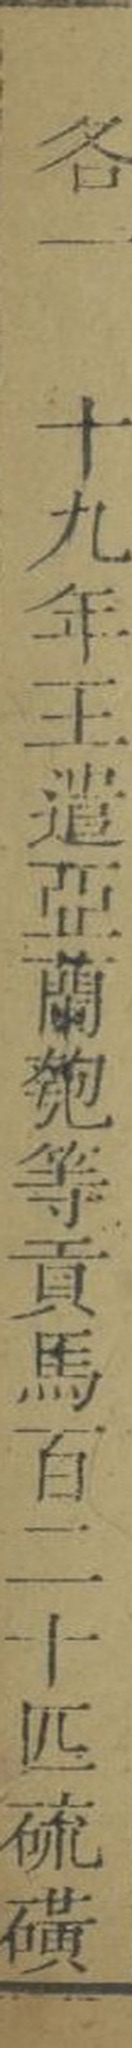各一十九年王遣亜蘭匏等貢馬百二十匹硫磺

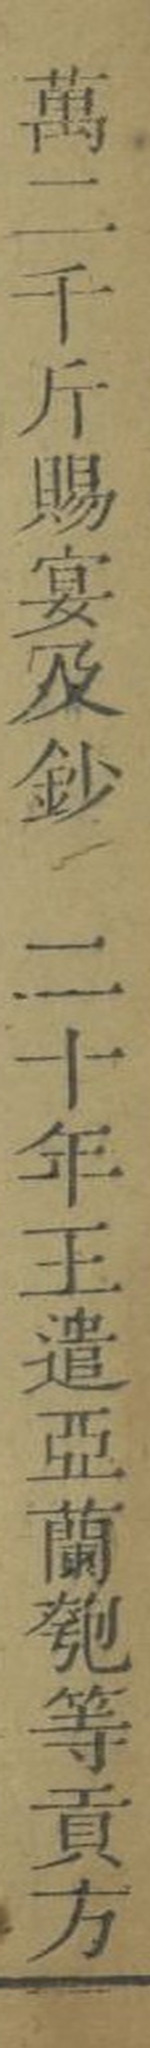万二千斤賜宴及鈔二十年王遣亜蘭匏等貢方
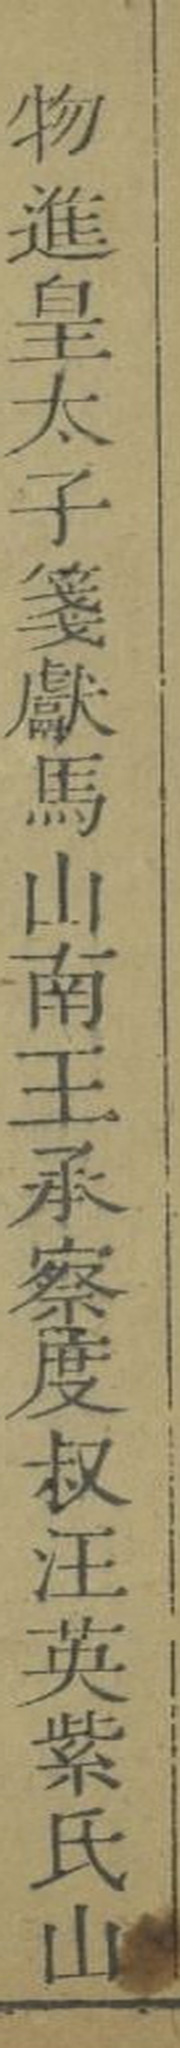物進皇太子箋献馬山南王承察度叔汪英紫氏山
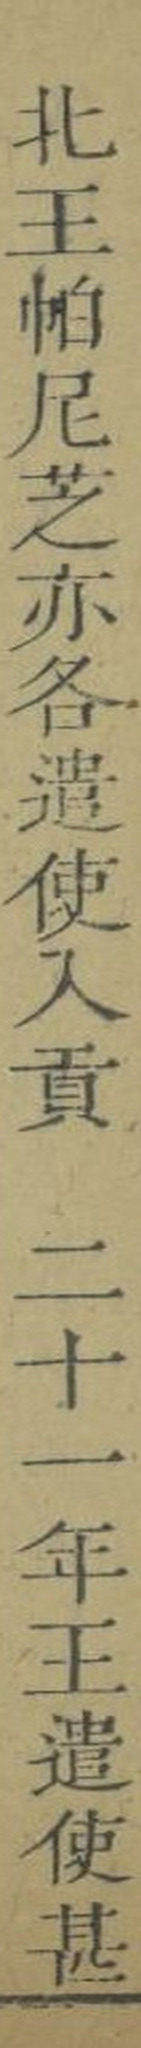北王帕尼芝亦各遣使入貢二十一年王遣使甚
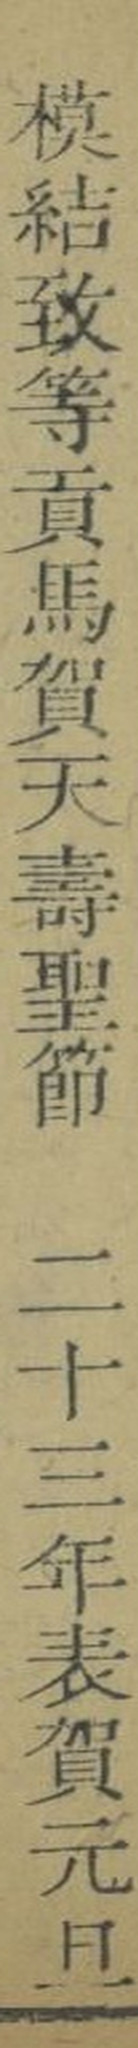模結致等貢馬賀天寿聖節二十三年表賀元旦
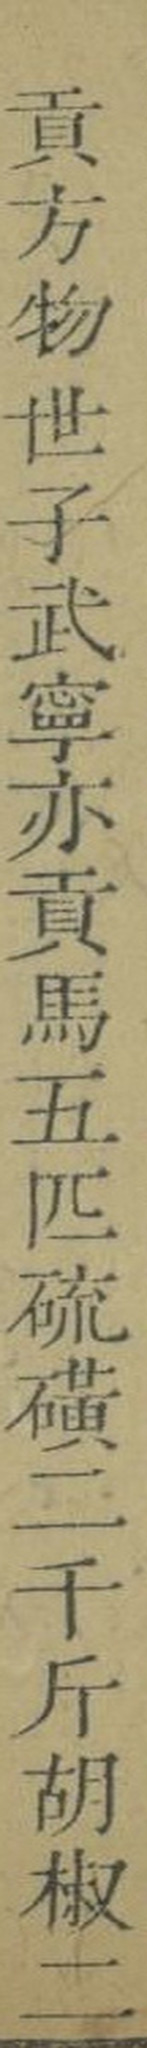貢方物世子武寧亦貢馬五匹硫磺二千斤胡椒二
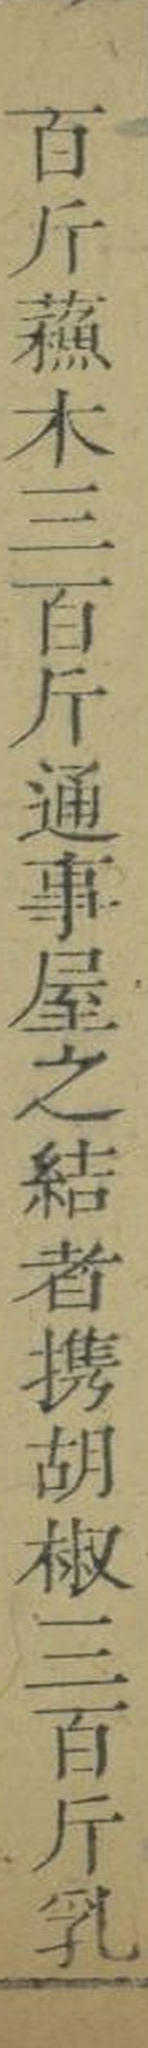百斤蘇木三百斤通事屋之結者携胡椒三百斤乳
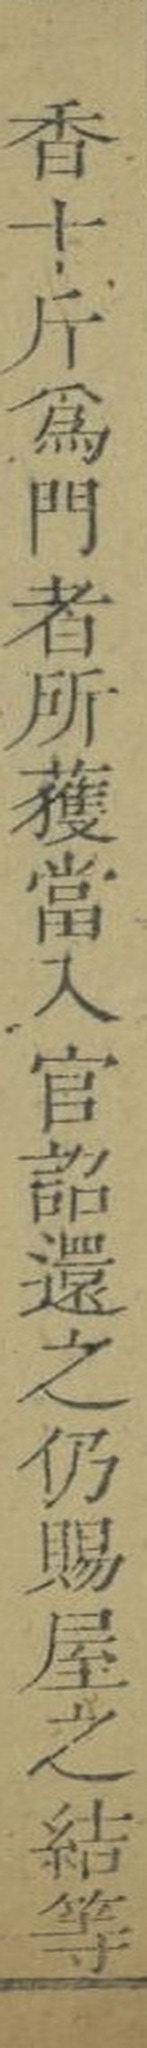香十斤為門者所獲当入官詔還之仍賜屋之結等
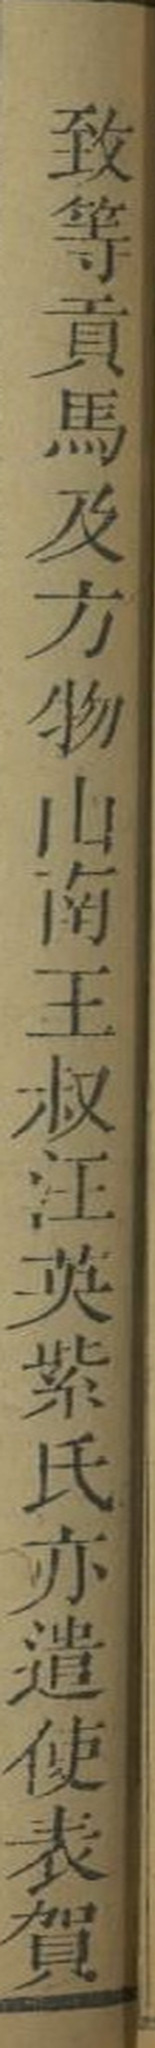致等貢馬及方物山南王叔汪英紫氏亦遣使表賀
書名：中山伝信録 巻三
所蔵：University of the Ryukyus Library
